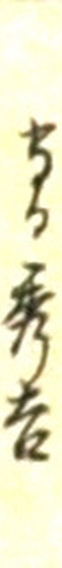守る秀吉
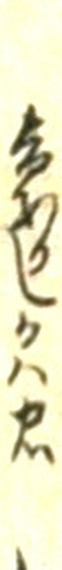旨ありしかは忠
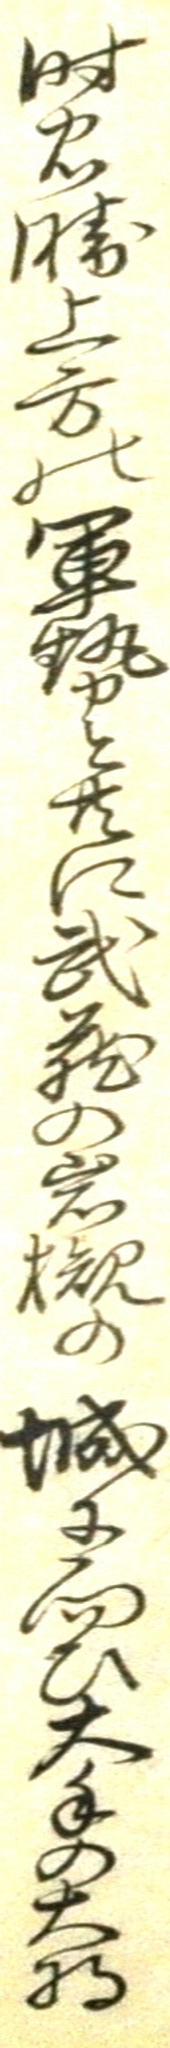時忠勝上方の軍勢と共に武蔵の岩槻の城に向ひ大手の大将
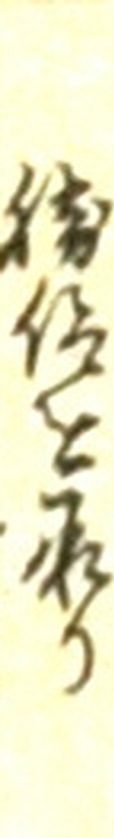勝仰を承り
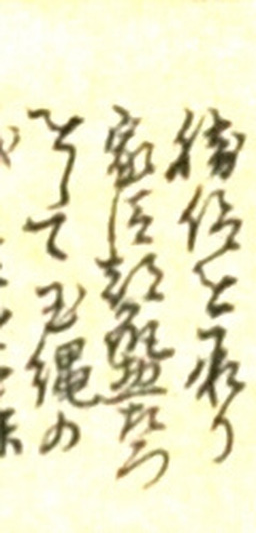家臣都筑惣左ヱ門
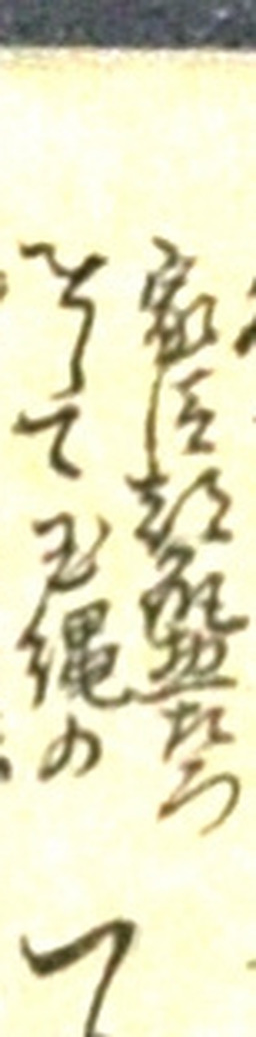をして玉縄の
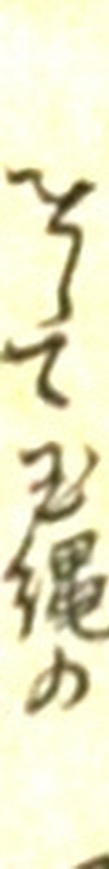をして玉縄の
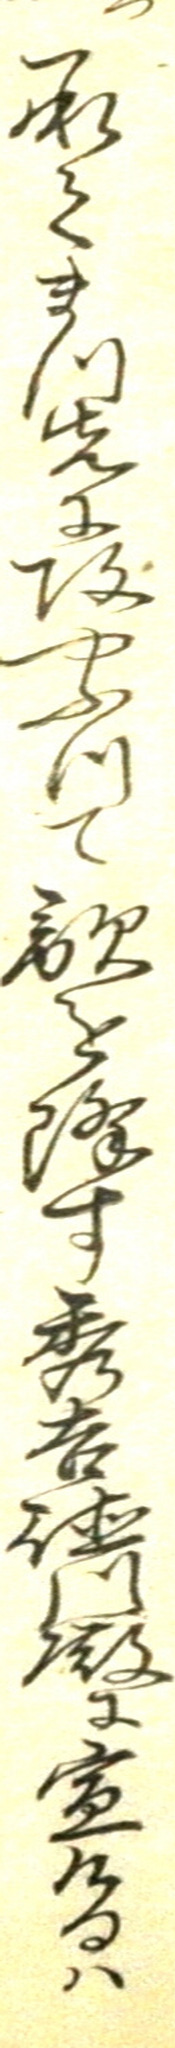承てまつ先に攻やふつて敵を降す秀吉徳川殿に宣けるは
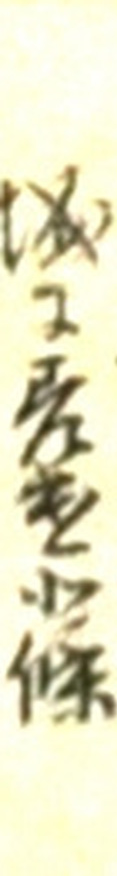城に差遣北条
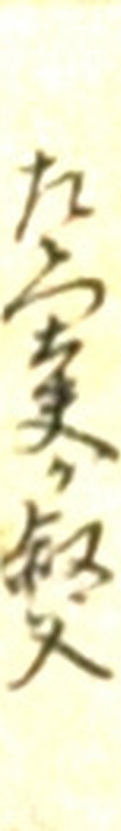左ヱ門大夫か叔父
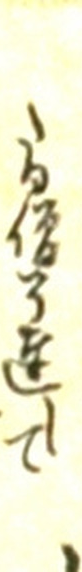たる僧了達して
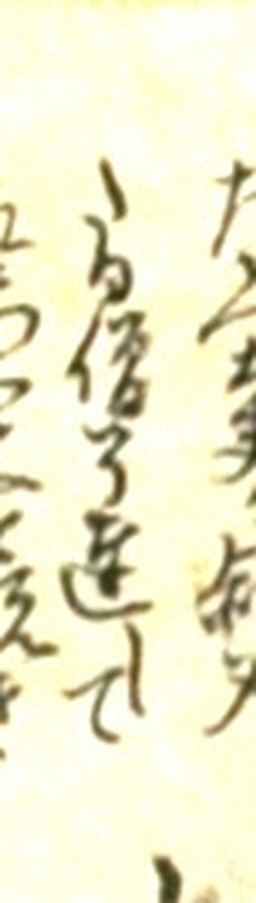左ヱ門大夫を説き
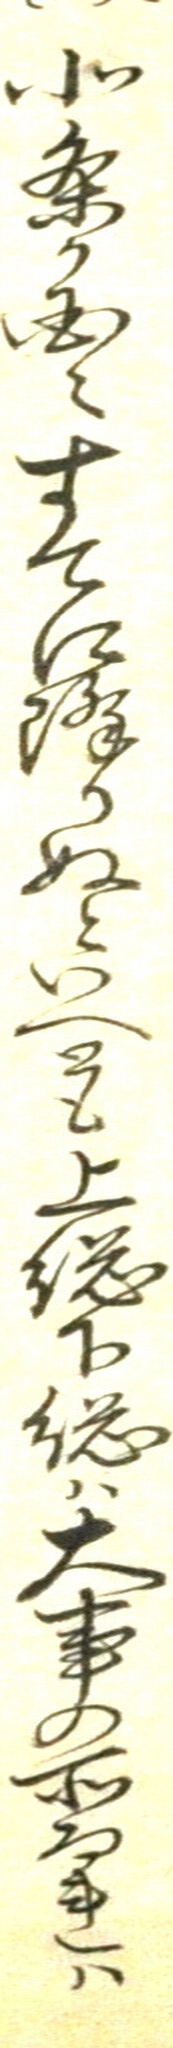北条か国々すてに降りぬといへとも上総下総は大事の所なれは
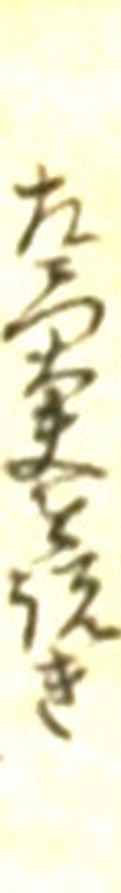左ヱ門大夫を説き
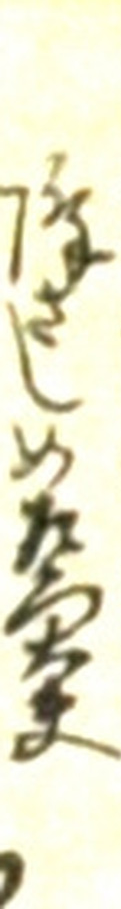降さしめ左ヱ門大夫
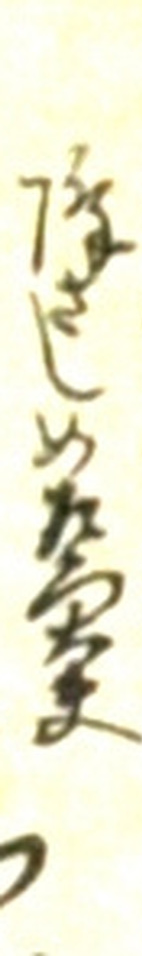降さしめ左ヱ門大夫
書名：藩翰譜（四・上）
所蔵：伊那市立高遠町図書館・合同会社AMANE
